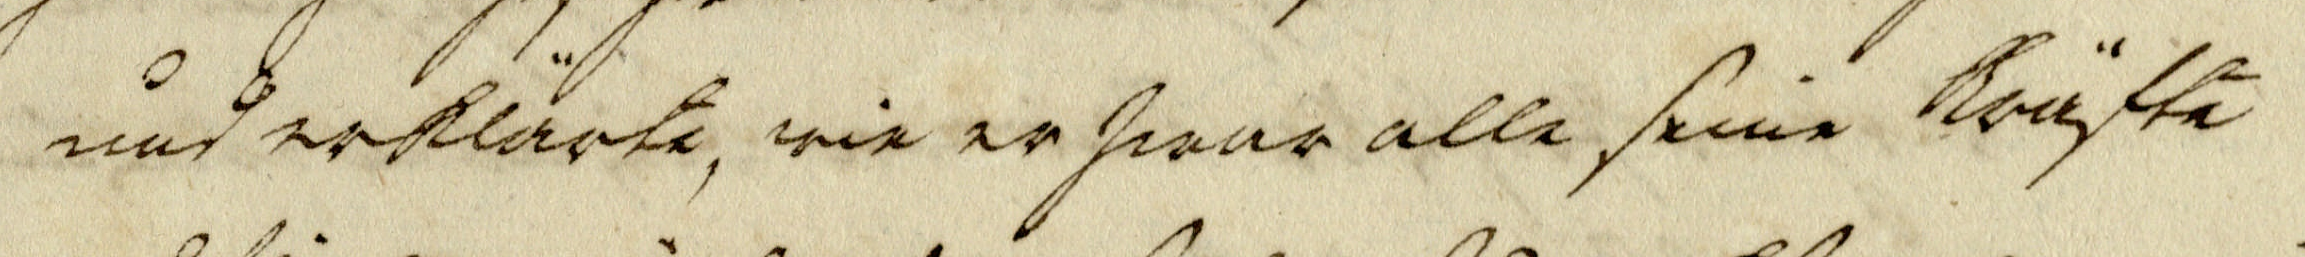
und erklärte, wie er zwar alle seine Kräfte
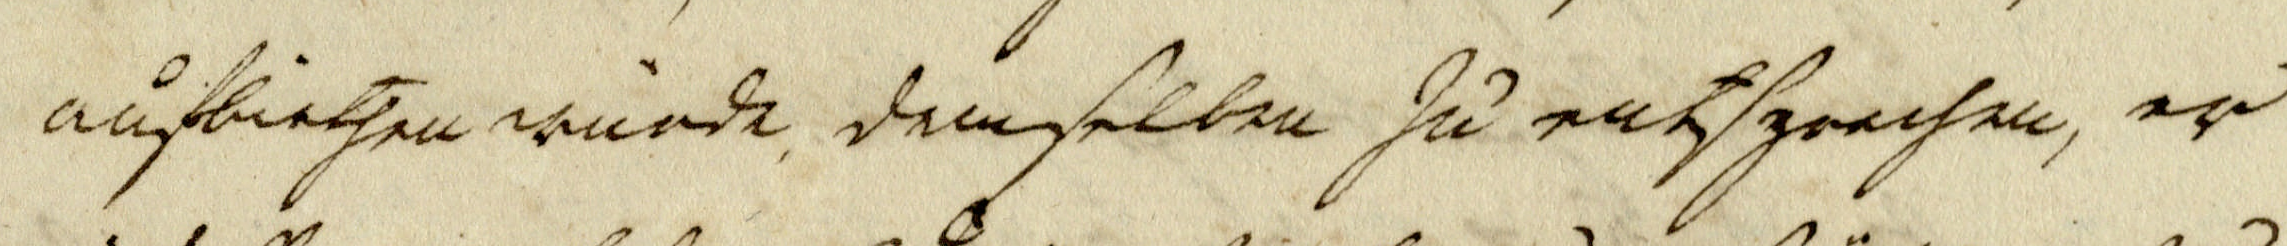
aufbiethen würde, demselben zu entsprechen, er
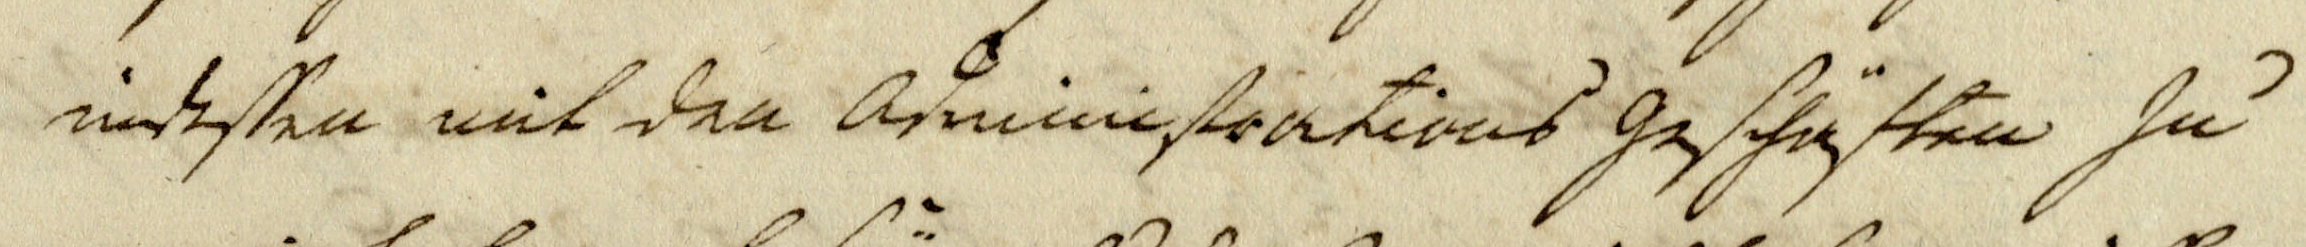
indessen mit den Adminstrations Geschäften zu
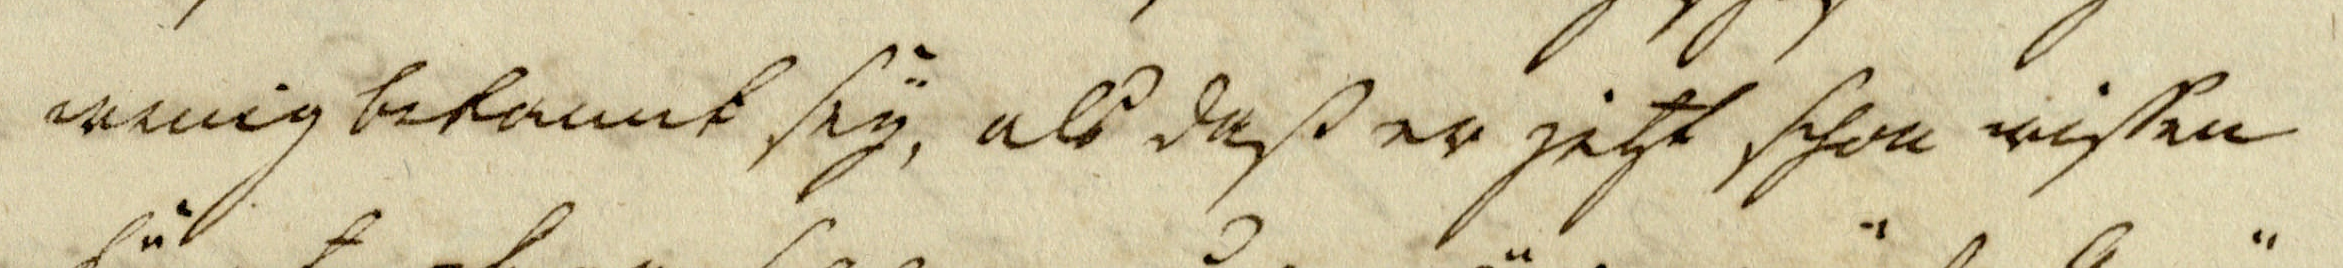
wenig bekannt seÿ, als daß er jetzt schon wissen
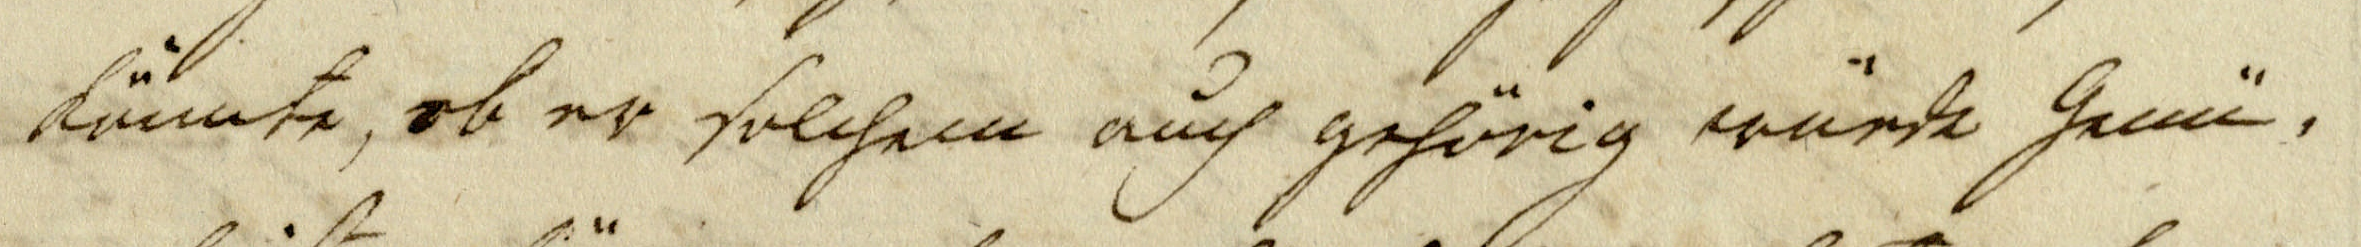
könnte, ob er solchem auch gehörig würde Genü¬
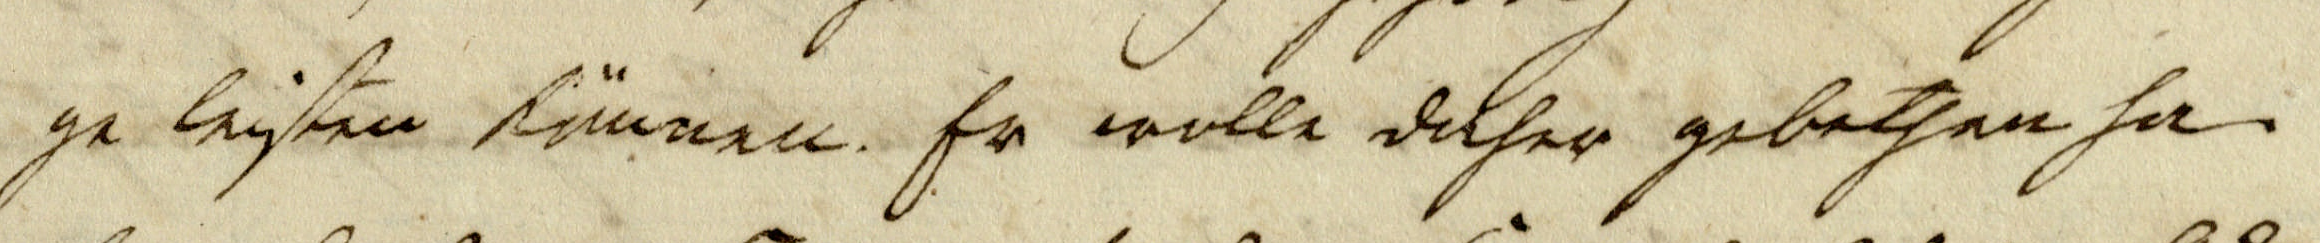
ge leisten können. Er wolle daher gebethen ha¬
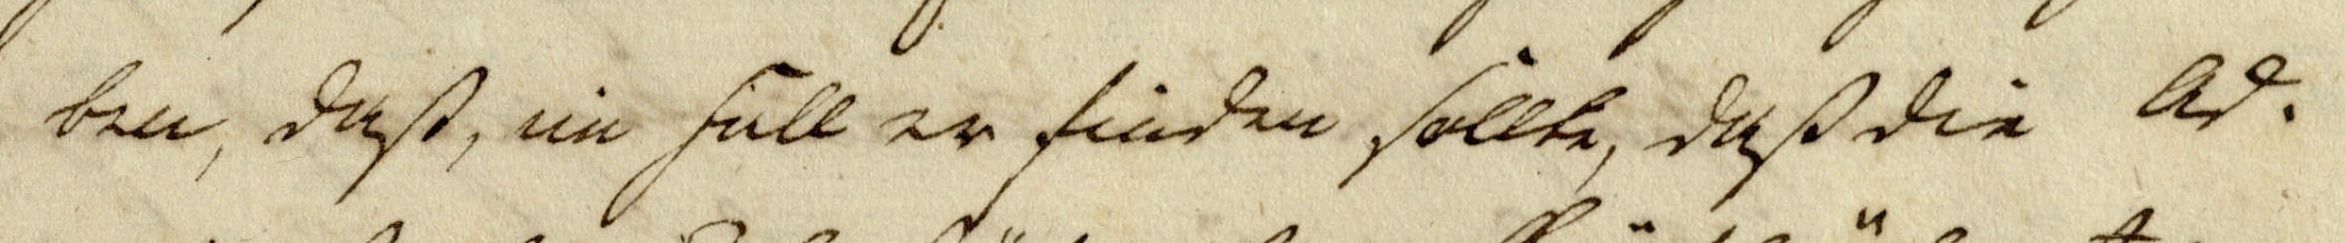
ben, daß, im Fall er finden sollte, daß die Ad¬
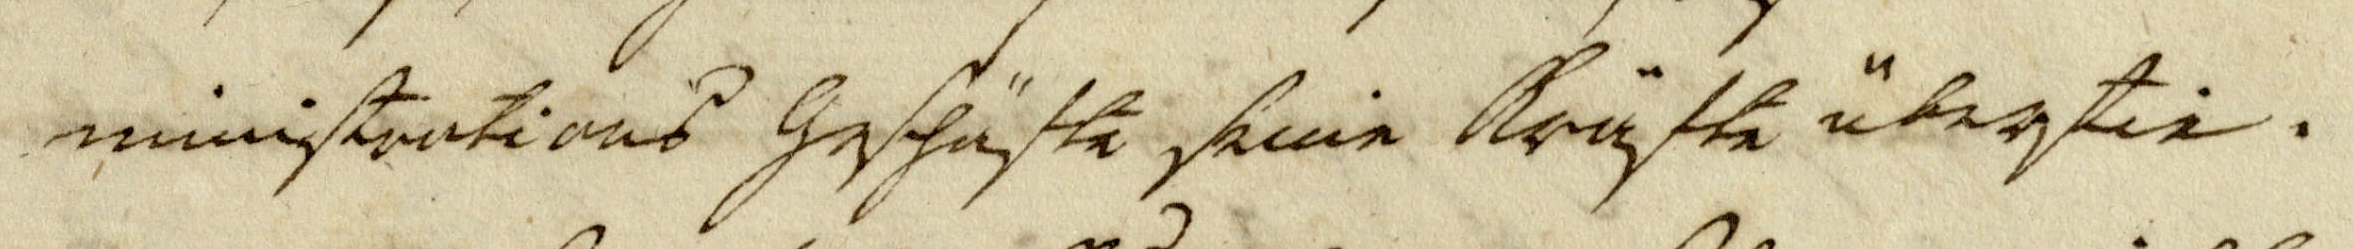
ministrations Geschäfte seine Kräfte überstie¬
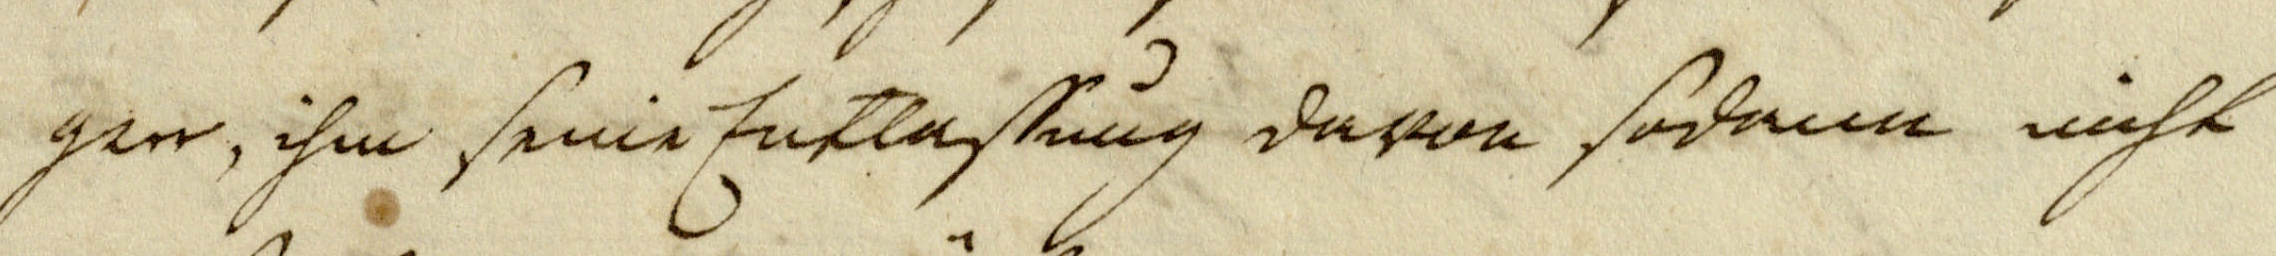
gen, ihm seine Entlassung davon sodann nicht
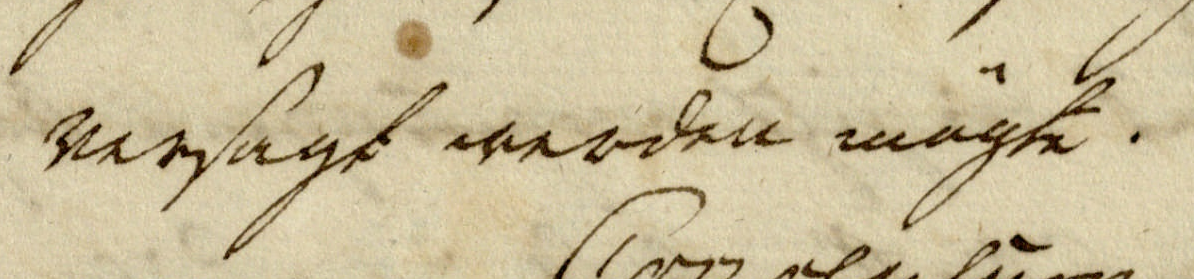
versagt werden mögte.
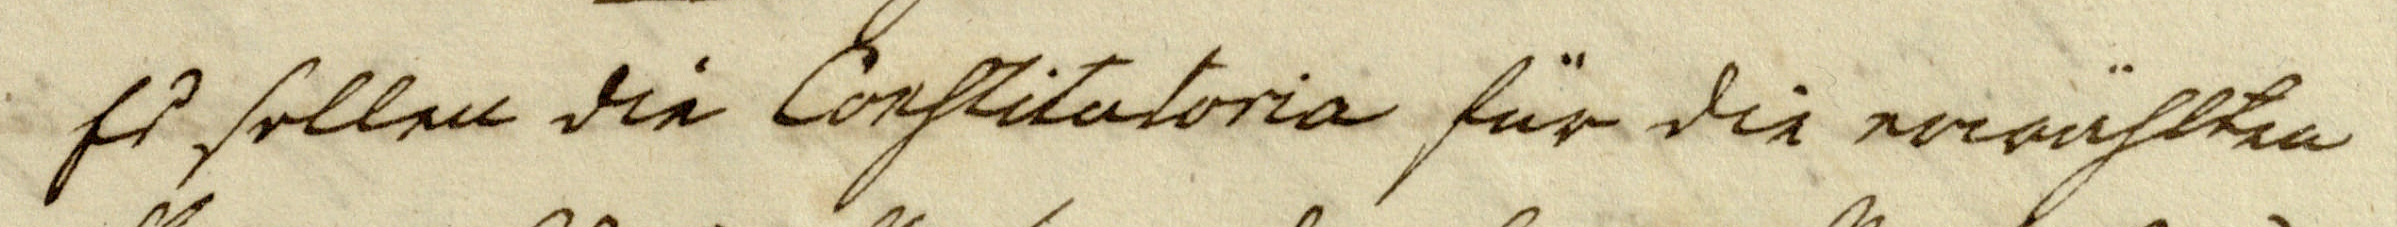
Es sollen die Constitutoria für die erwählten
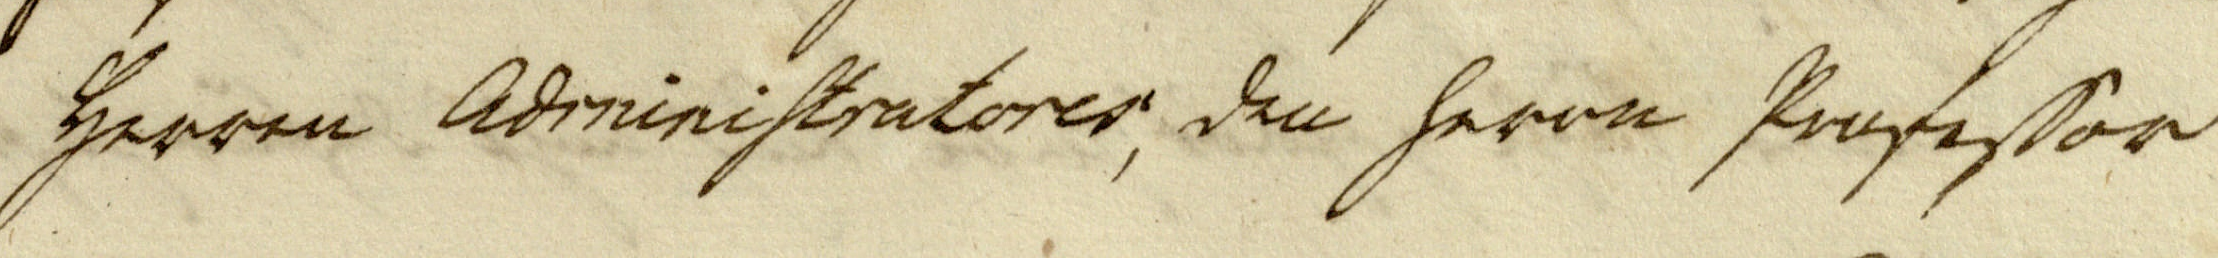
Herren Administratores, den Herrn Professor
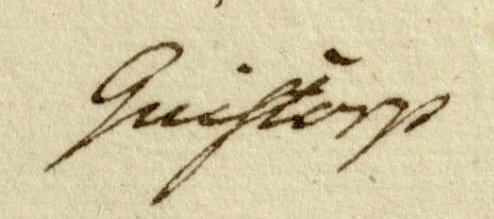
Quistorp
